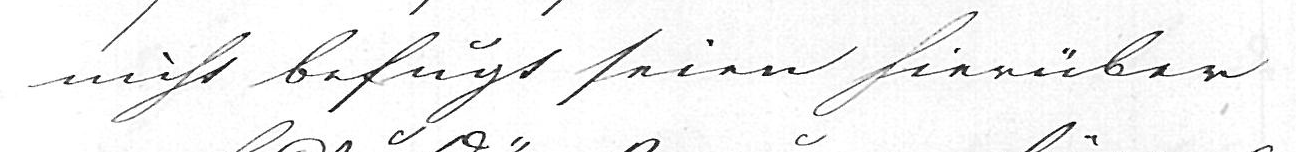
nicht befugt seien hierüber
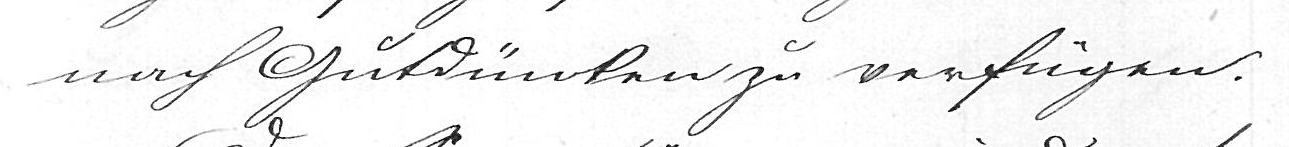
nach Gutdünken zu verfügen.
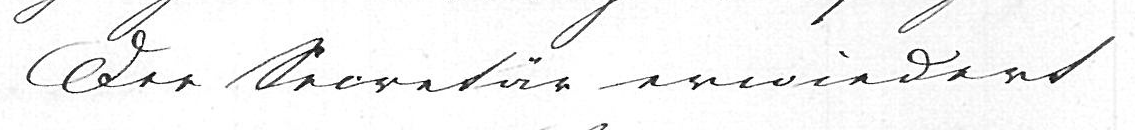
Der Secretär erwidert
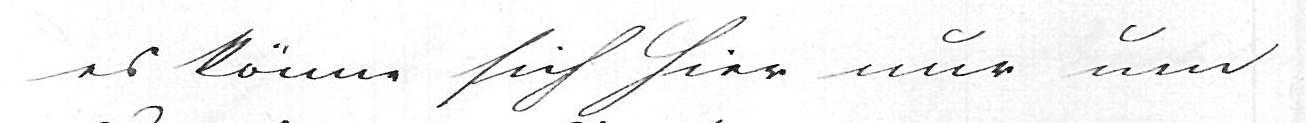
es könne sich hier nur um
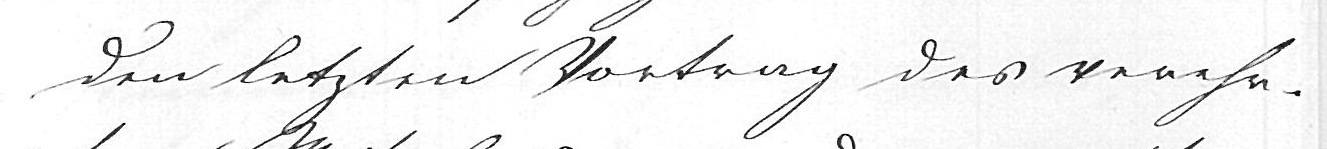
den letzten Vortrag des verehr-
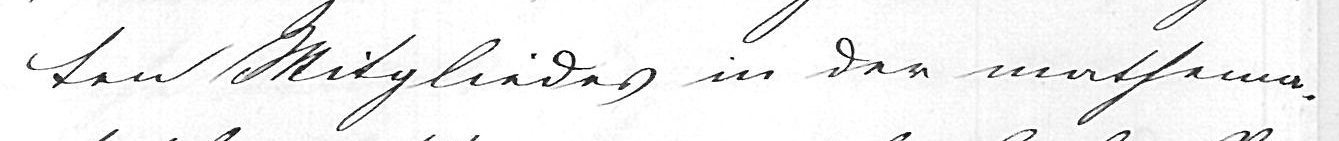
ten Mitgliedes in der mathema-
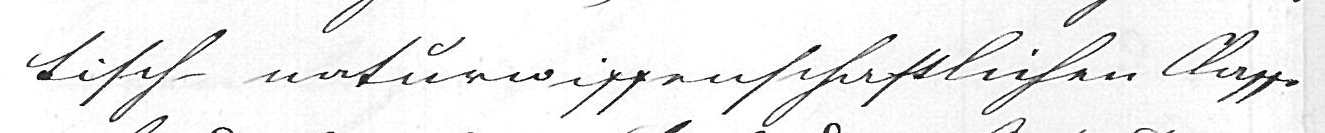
tisch-naturwissenschaftlichen Classe
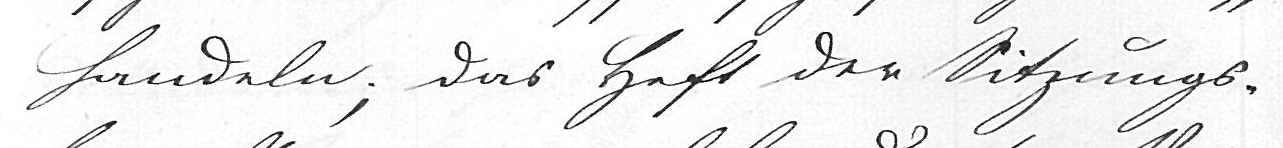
handeln; das Heft der Sitzungs-
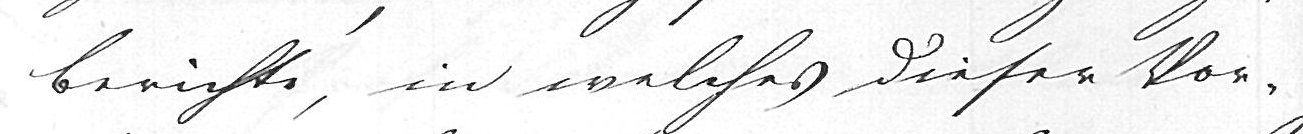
berichte, in welches dieser Vor-
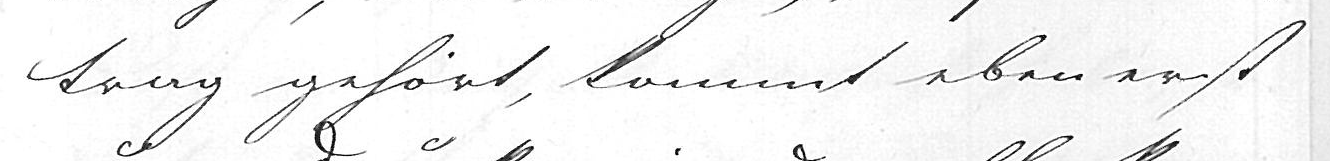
trag gehört, kommt eben erst
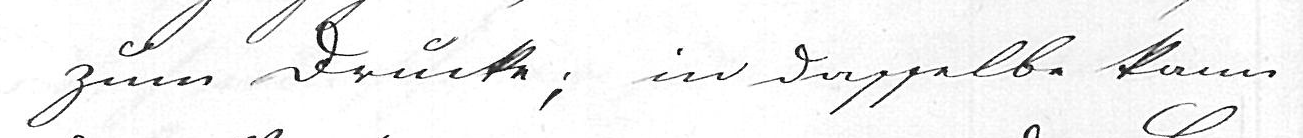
zum Drucke; in dasselbe kann
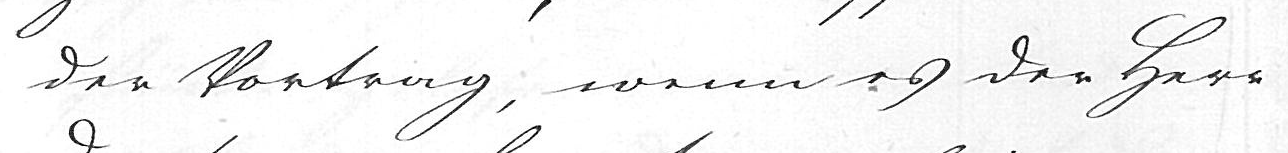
der Vortrag, wenn es der Herr
